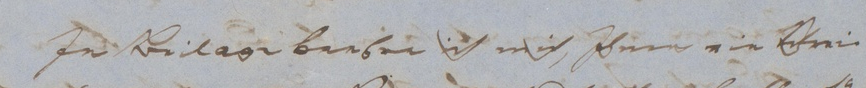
In Beilage beehre ich mich, Ihnen ein Schrei-
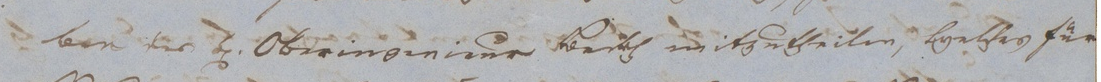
ben des Hr. Oberingenieur Beckh mitzutheilen, welches für
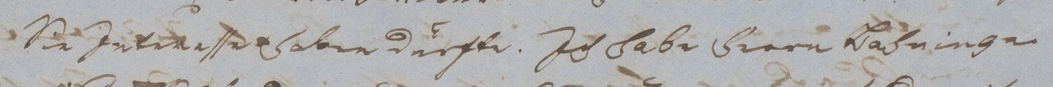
Sie Interesse haben dürfte. Ich habe Herrn Bahninge-
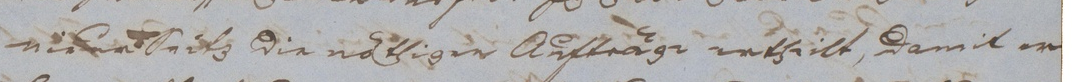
nieur Seitz die nöthigen Aufträge ertheilt, damit er
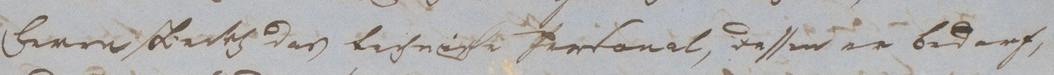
Herrn Beckh das technische Personal, dessen er bedarf,
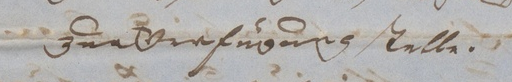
zur Verfügung stelle.
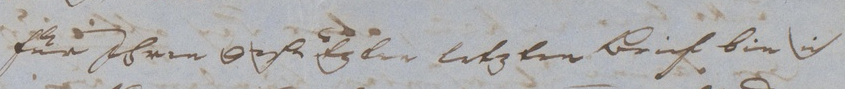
Für Ihren geschätzten letzten Brief bin ich
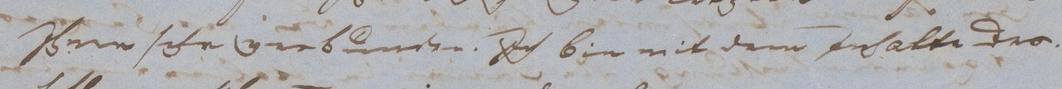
Ihnen sehr verbunden. Ich bin mit dem Inhalte des-
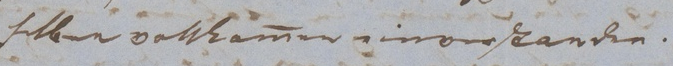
selben vollkommen einverstanden.
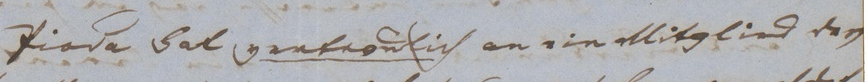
Pioda hat vertraulich an ein Mitglied des
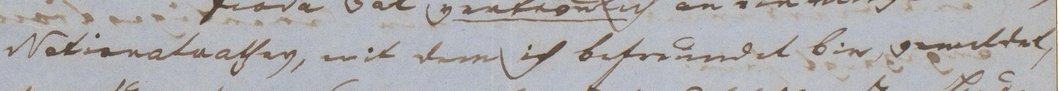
Nationalrathes, mit dem ich befreundet bin, gemeldet,
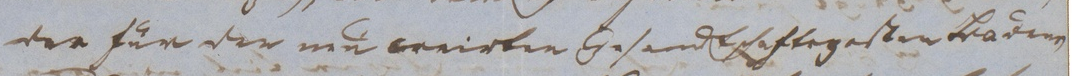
der für den neu creirten Gesandtschaftsposten Badens
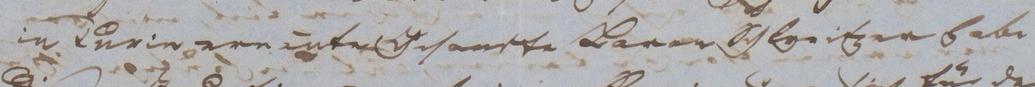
in Turin ernannte Gesandte Baron Schweitzer habe
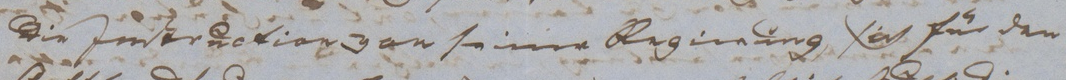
die Instruction von seiner Regierung, sich für den
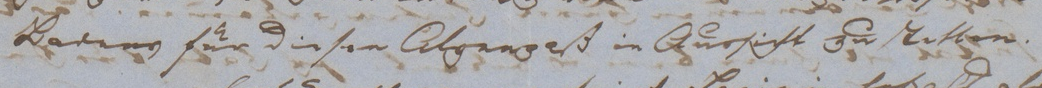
Badens für diesen Alpenpaß in Aussicht zu stellen.
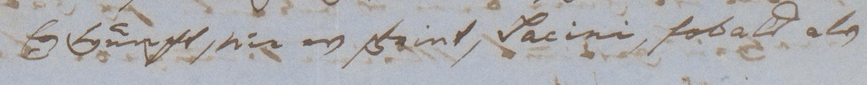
Es wünscht, wie es scheint, Jacini, sobald als
